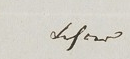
Lehrer
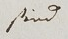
sind
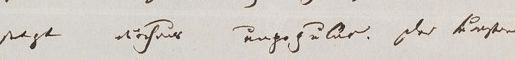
jetzt durchaus unpopulär. Der Umstand,
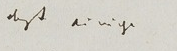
daß einige
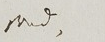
sind,
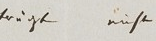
trägt nicht
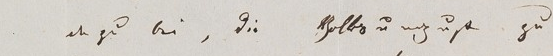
dazu bei, die Volksungunst zu
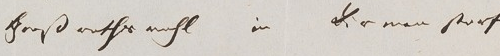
Großrathswahl in Birmenstorf
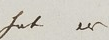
hat es
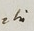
Freien
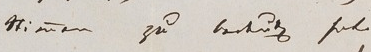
Stimmen zu bedeuten hat.
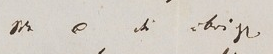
Sie & die übrigen
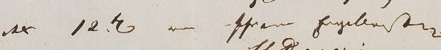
des 12ten von Ihrem Ergebensten
